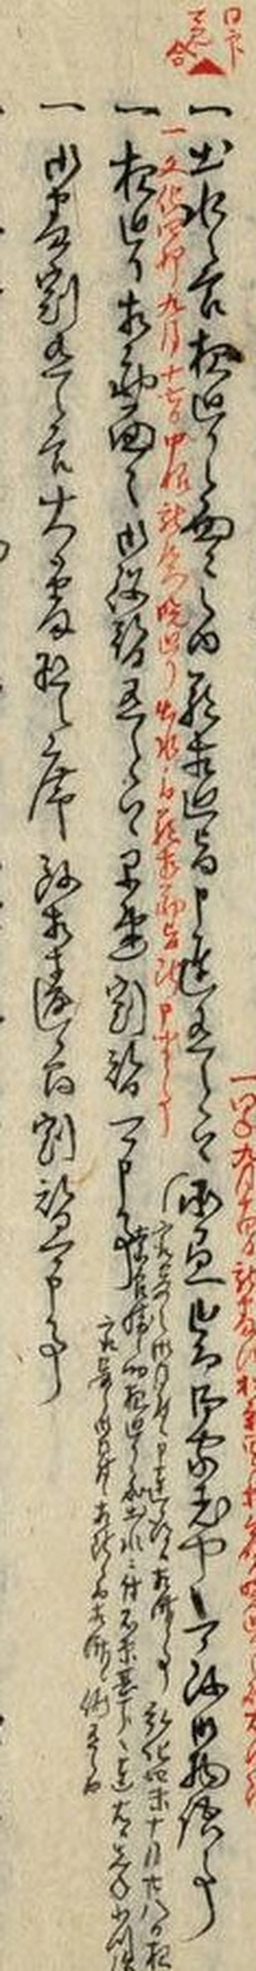一夜廻り相勤面々御役替有之候はゝ早速割替可申事
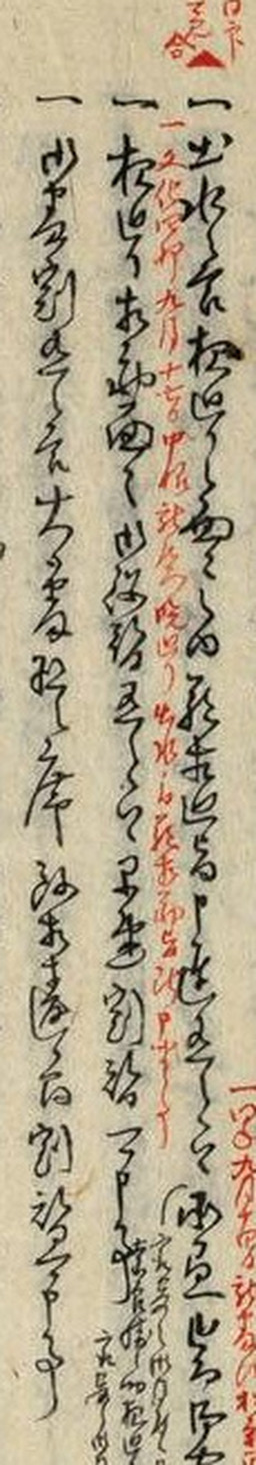一夜廻り相勤面々御役替有之候はゝ早速割替可申事
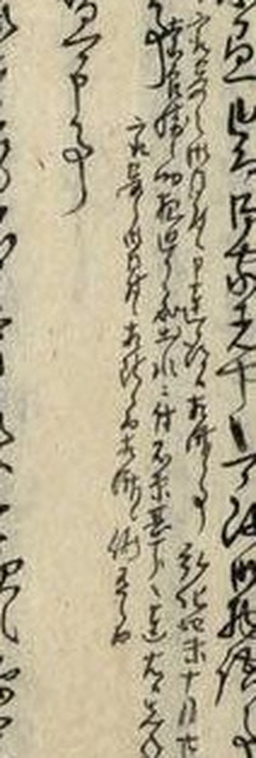最寄御目付へ相断候て相済候例有之由
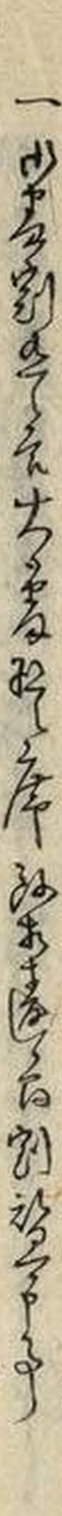一御番割有之節大番組之席致相違候間割替可申事
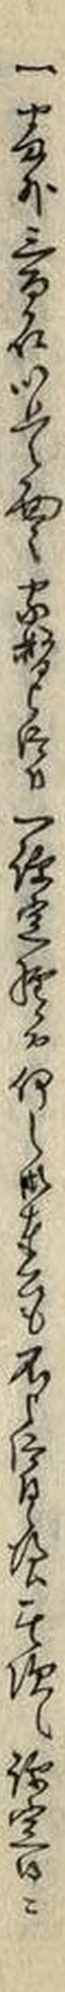一番外三百石以上之面々家督被仰付一評定経候て何之御奉公も不被仰付候得は其次之評定日に
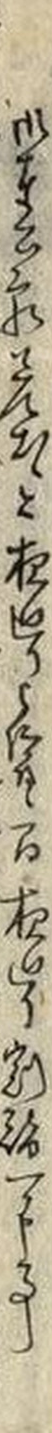御奉公願差出候は夜廻り被仰付候間夜廻り割替可申事
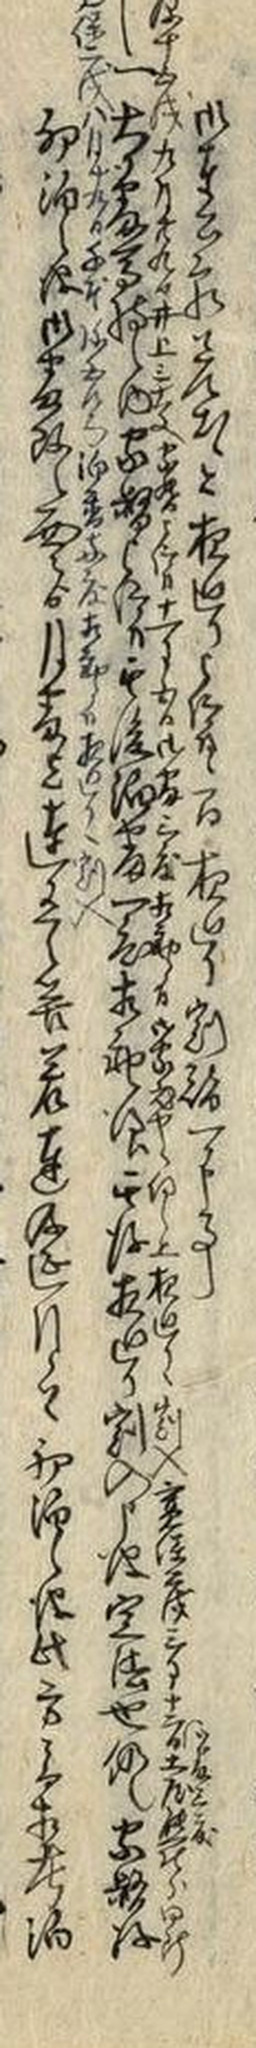一大御番馬持之内家督被仰付其後泊番一度相勤候得は其後夜廻り割入申儀定法也依之家督後
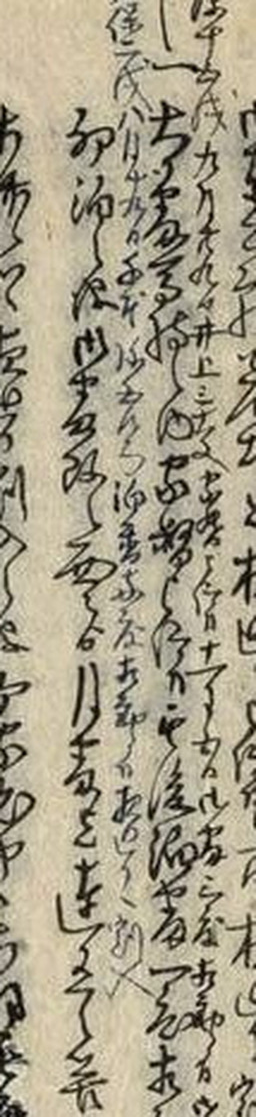一寛保二戌八月十九日千本弥五左衛門泊番両度相勤候に付夜廻りへ割入
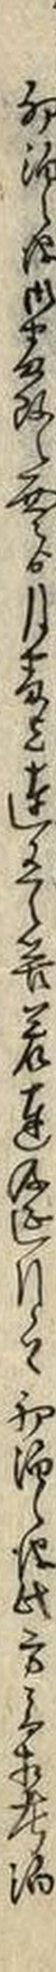初泊之儀御番改之面々ゟ月番迄達有之筈若達及延引候はゝ初泊之儀此方にて相考泊
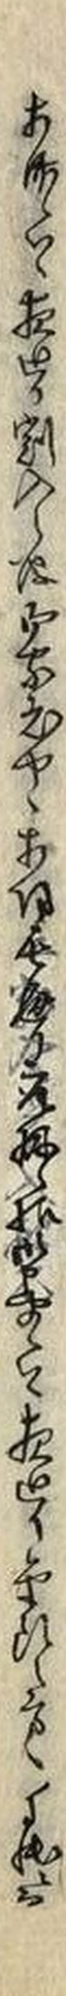相済候はゝ夜廻り割入之儀御家老中へ相伺其通り取扱候様御申聞候はゝ夜廻り筆頭之方へ手紙にて
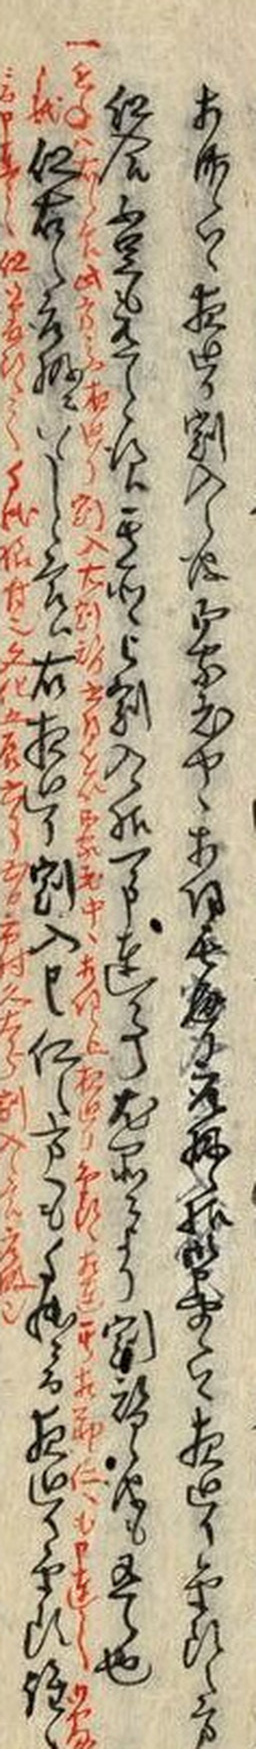組合不足も有之候得は其所へ被割入候様可申達候事尤品により割替之儀も有之也
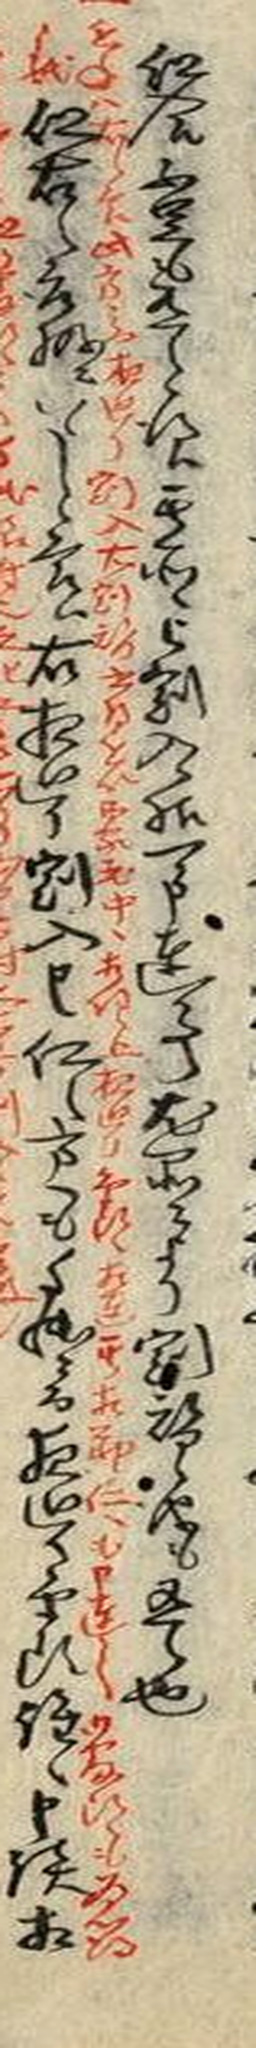但右之取扱にいたし候節は右夜廻り割入申候仁之方へも手紙にて夜廻り筆頭誰へ申談相
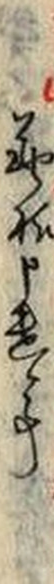勤様申遣候事
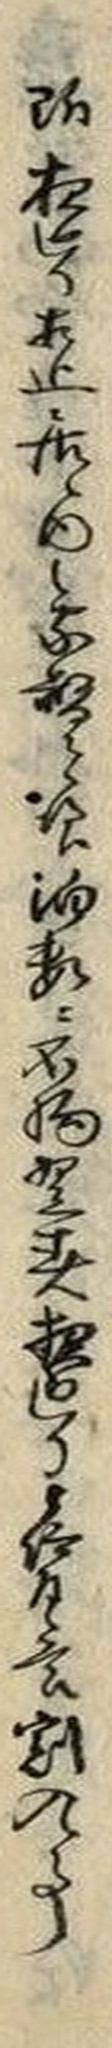附夜廻り相止居候内之家督に候得は泊数に不拘翌春夜廻り被仰付候節割入候事

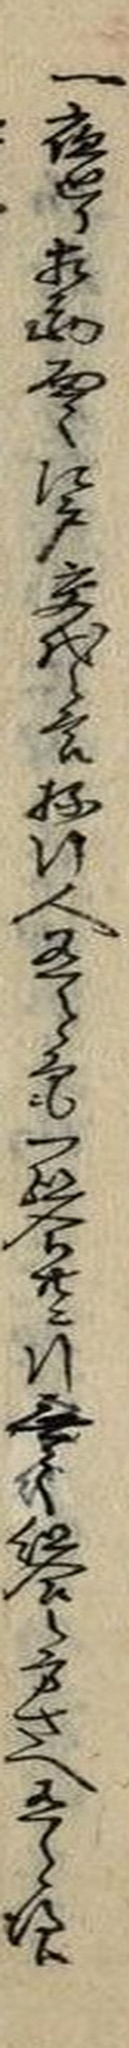一夜廻り相勤面々江戸交代之節抔引人有之候ても一組合共に引無之組合之方さへ有之候得は
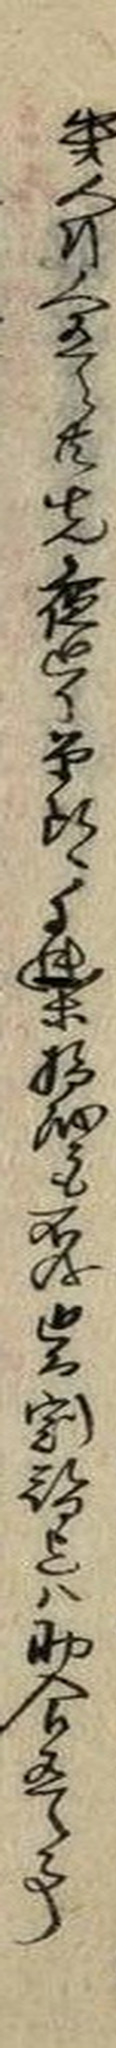幾人引人有之候共先夜廻り筆頭へ手紙等指越にも不及追て割替迄は助合有之事
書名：御城下諸事之部
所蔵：福井県文書館 Fukui Prefectural Archives
